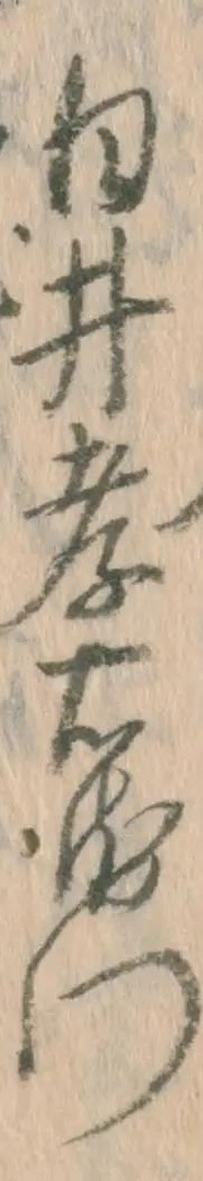向井孝右衛門
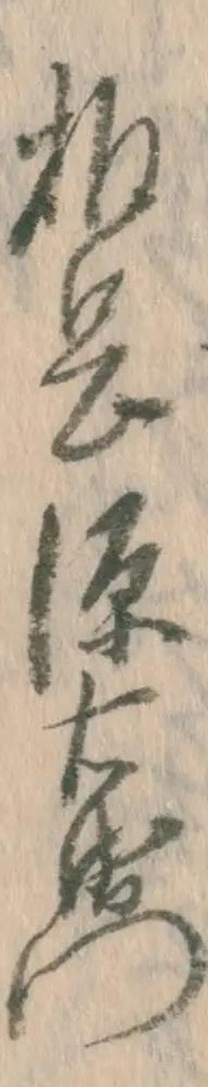板岡源右衛門
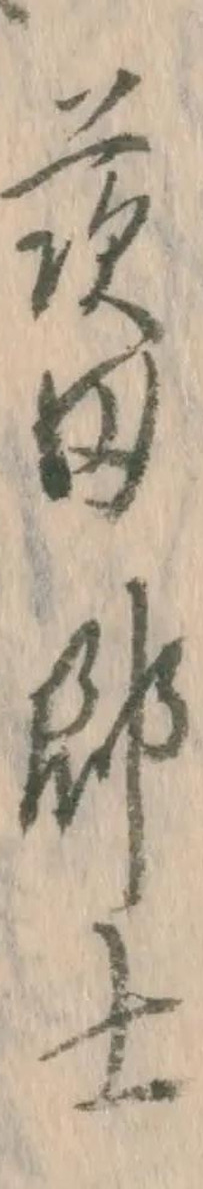茨田郡士
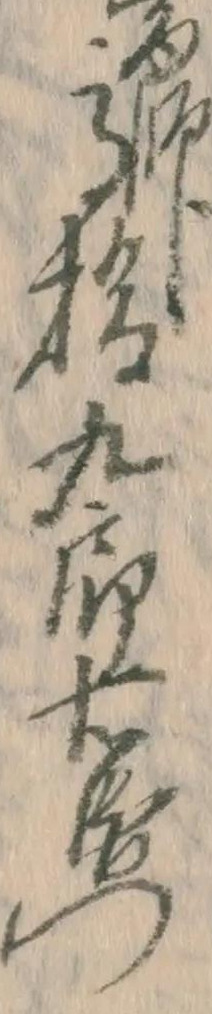吉見九郎右衛門
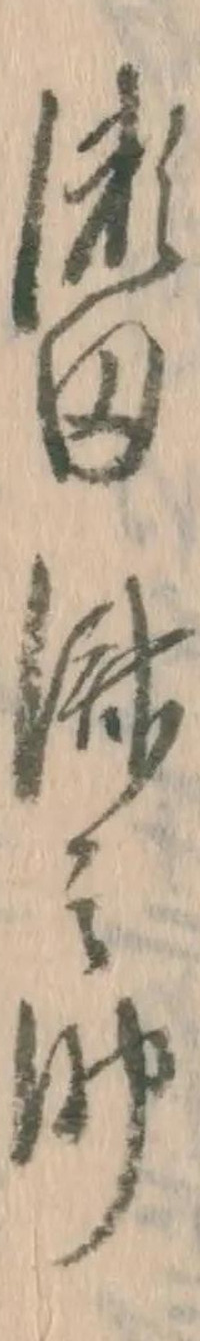瀬田済之助
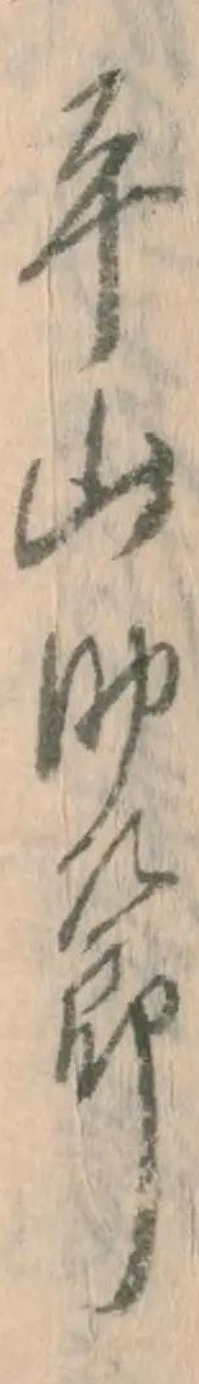平山助次郎
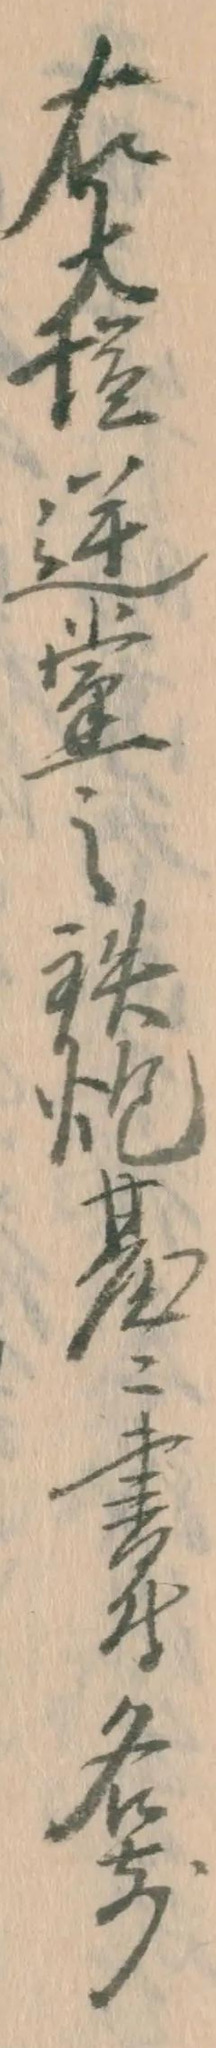右大塩逆堂之鉄砲䑓ニ書付各前
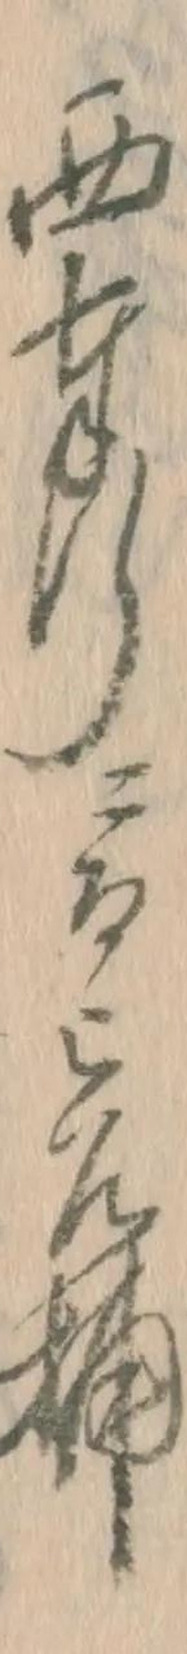西奉行ニ而被召捕候
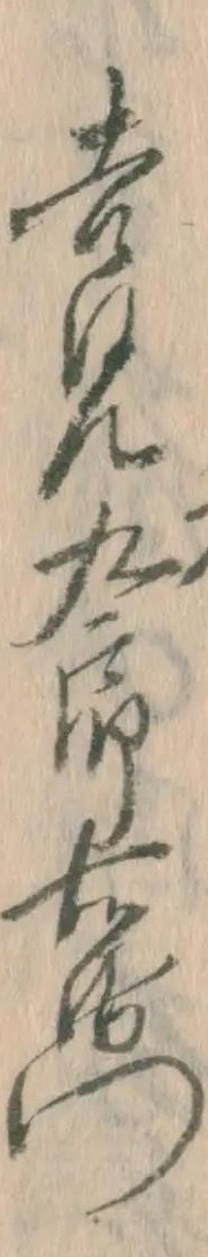吉見九郎右衛門
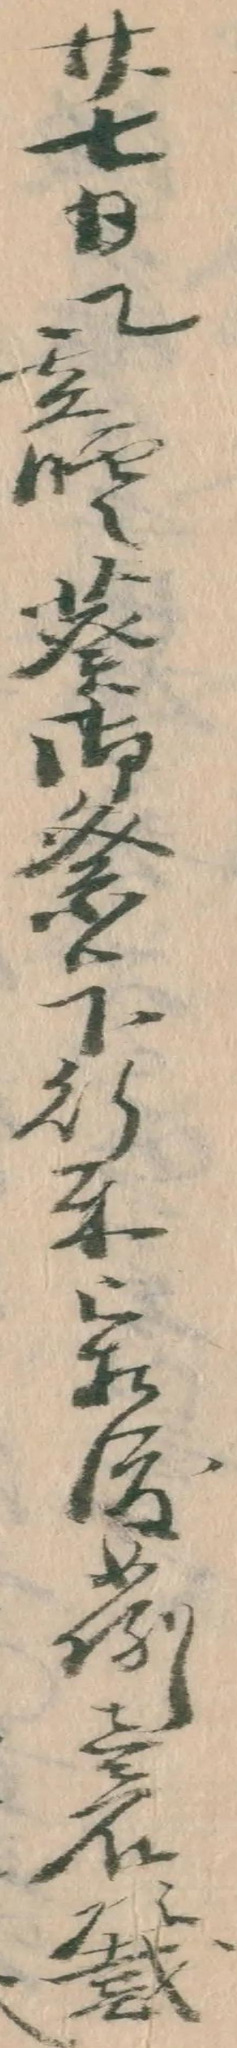廿七日乙亥曇葵御祭候下行来被相渡如例壱石頂戴
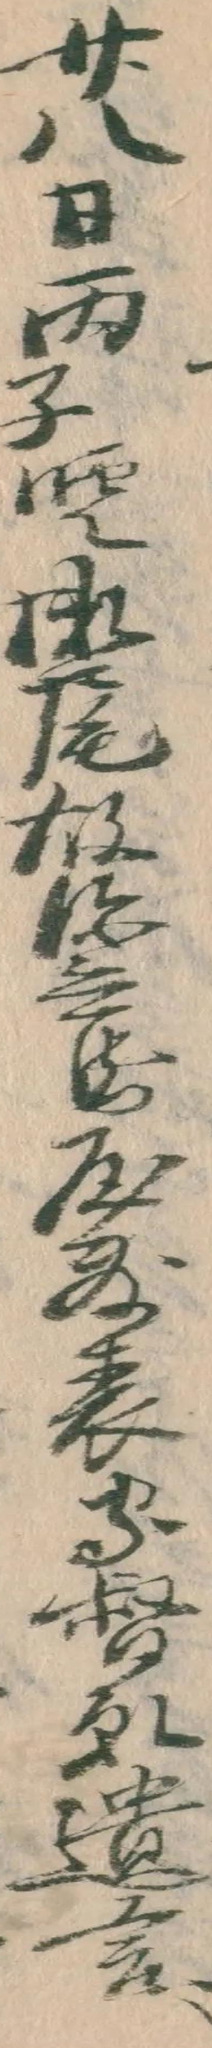廿八日丙子曇瀬尾故弥兵衛屋敷表家督願遺言
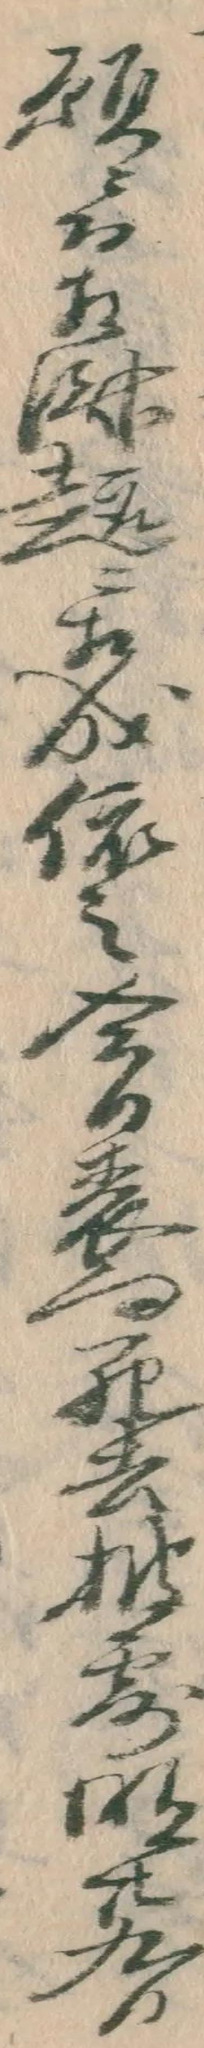願ニ而相済趣ニ相成依之今日表向罷去披露明廿九日
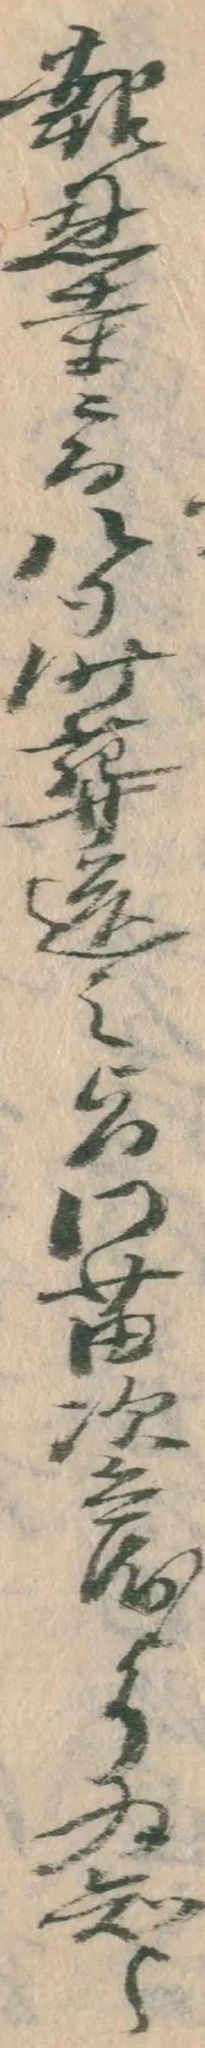報恩寺ニ而八ツ時葬送之旨同苗次兵衛より為知申
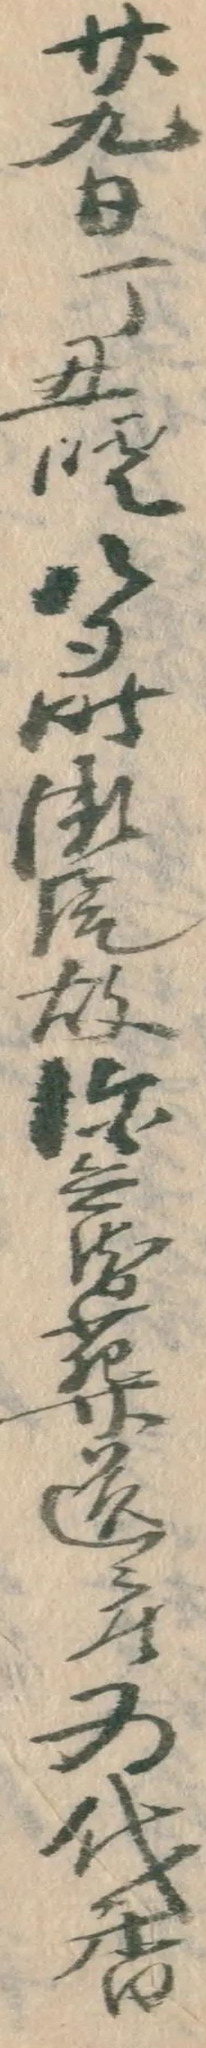廿九日丁丑曇八ツ時瀬尾故弥兵衛葬送ニ付為代香
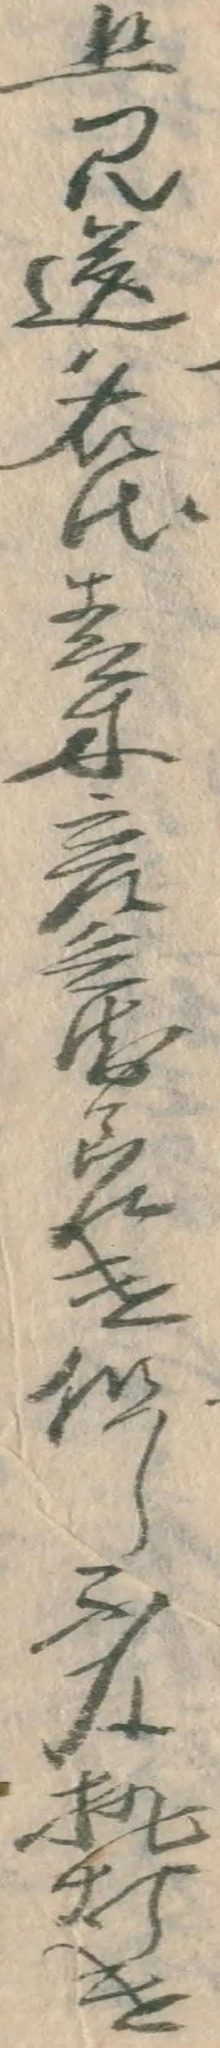但見送名代青木彦兵衛差遣但し不及挑灯遣
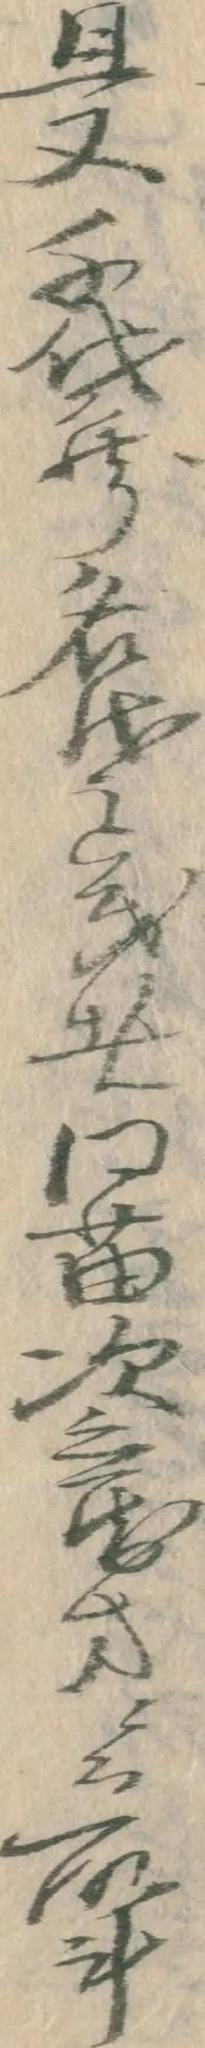且又千代蔵名代之義者同苗次兵衛方ニ而取斗
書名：賀茂社記録. 第67冊
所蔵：国立国会図書館 National Diet Library, JAPAN
